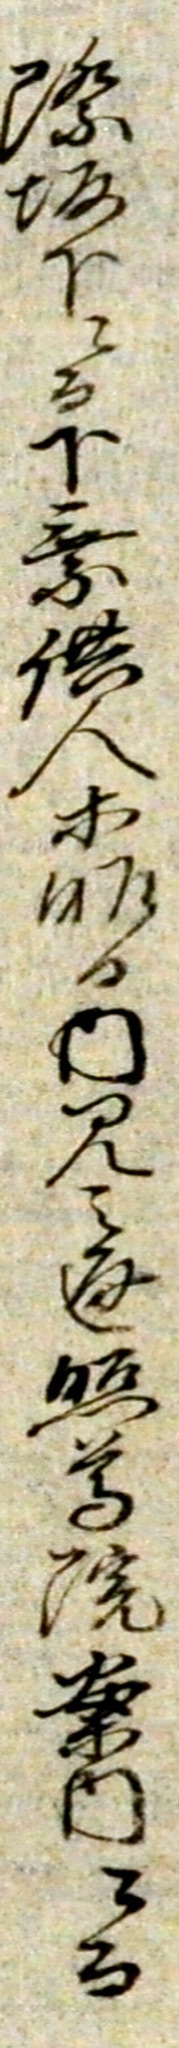際坂下ニ而下乗供人等昨日内見之通照尊院案内ニ而
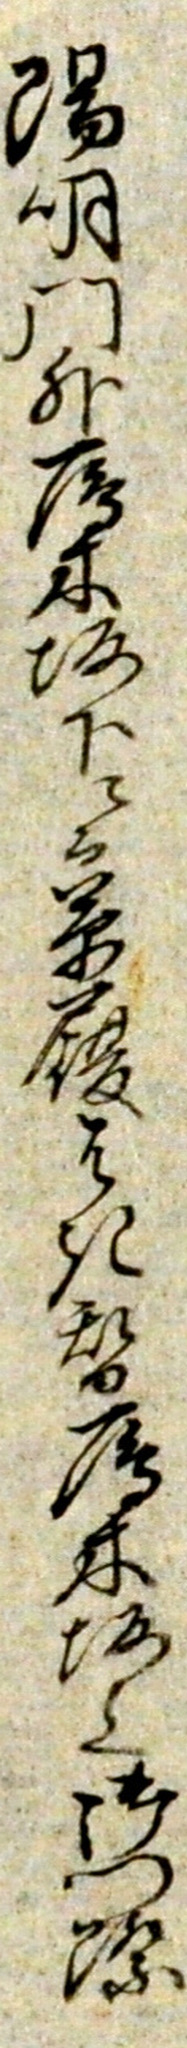陽明門外雁木坂下ニ而草履はき替雁木坂上御門際
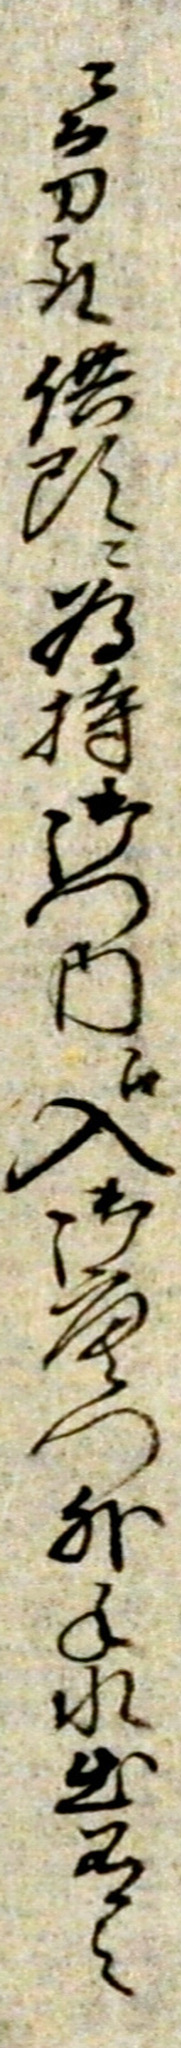ニ而刀取供頭ニ為持御門内江入御唐門外手水出有之
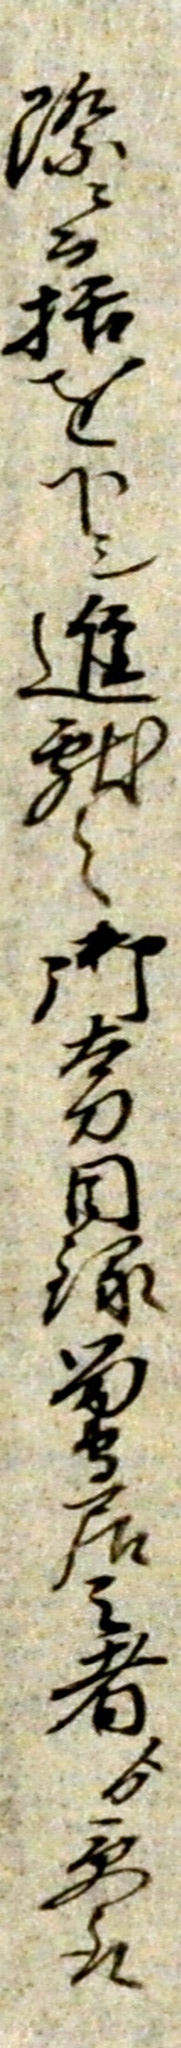際ニ而据を下シ進献之御太刀目録留守居之者ゟ受取
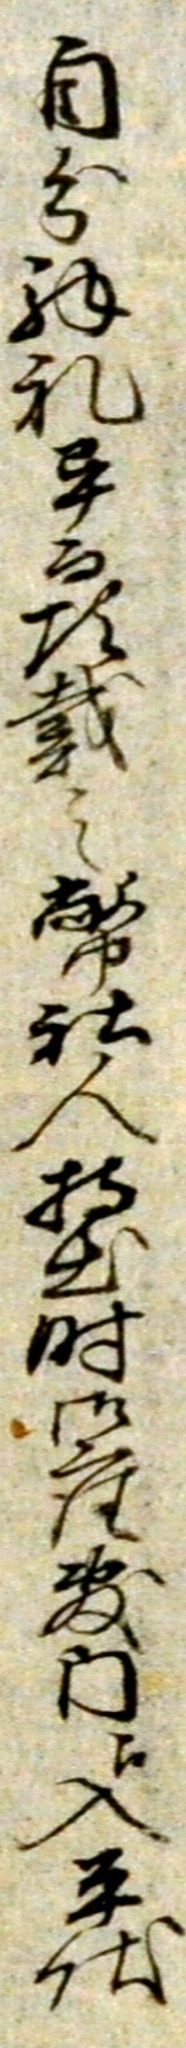見受候而自分拝礼畢而頂戴之幣社人持出時御座敷内平伏
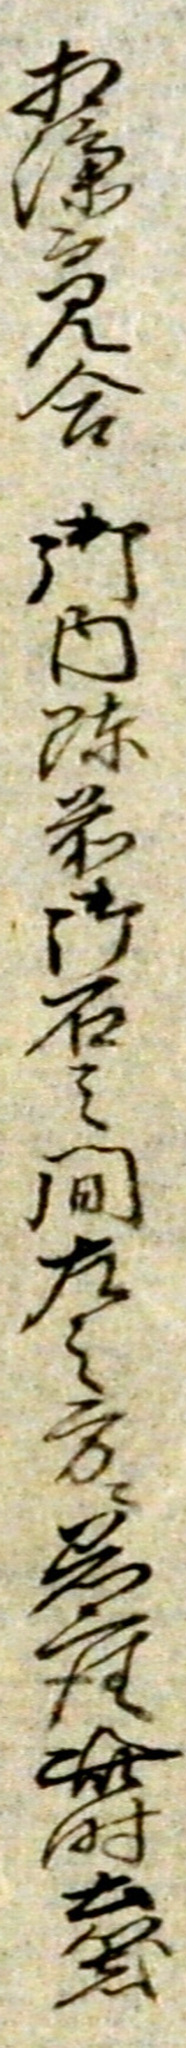相済而見御内陳前御石之間左之方ニ着座此時土器
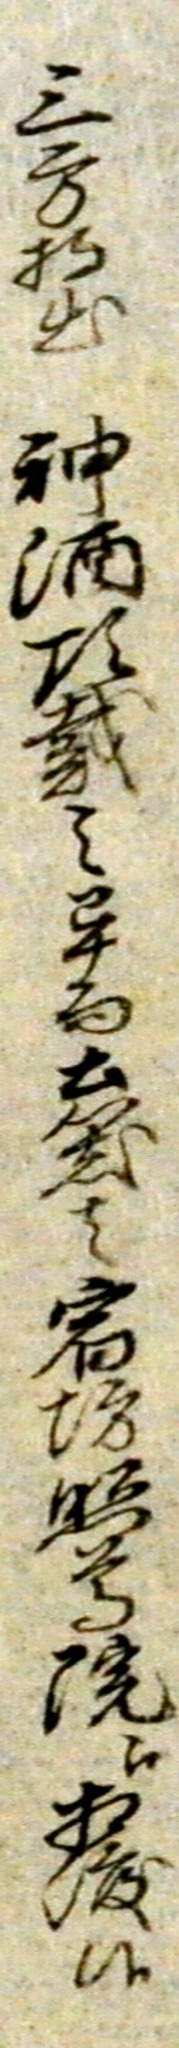三方向持出神酒頂戴者畢而土器者宿坊照尊院江相渡候
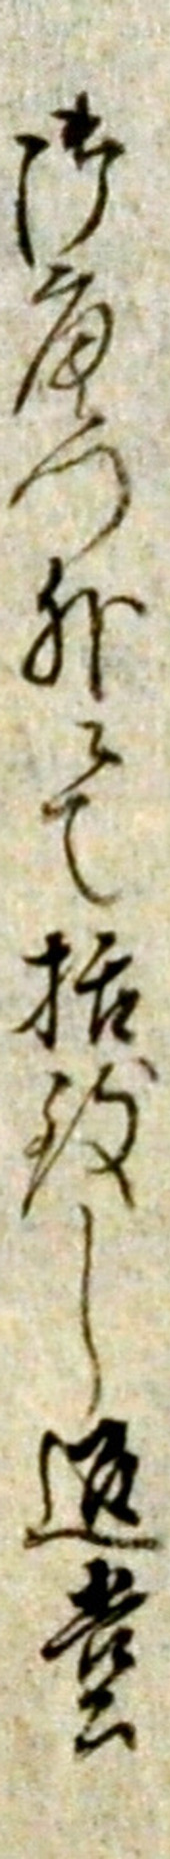御唐門外ニて括致し退去候
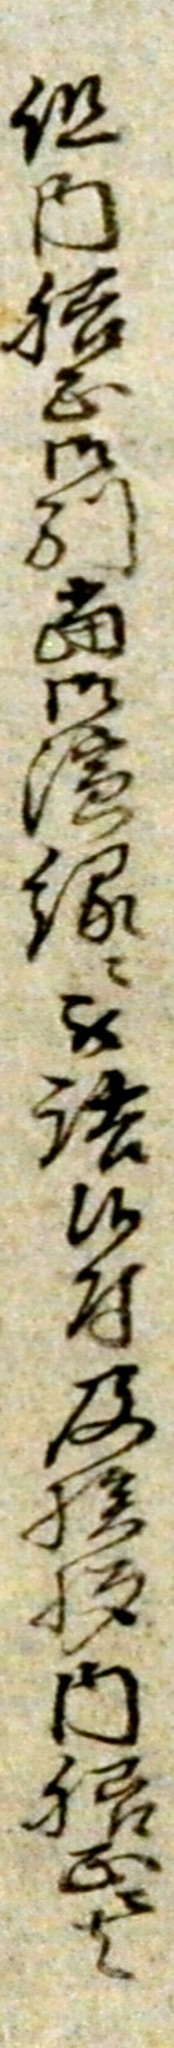但内膳正御別当御演縁ニ被詰候ニ付及挨拶内膳正

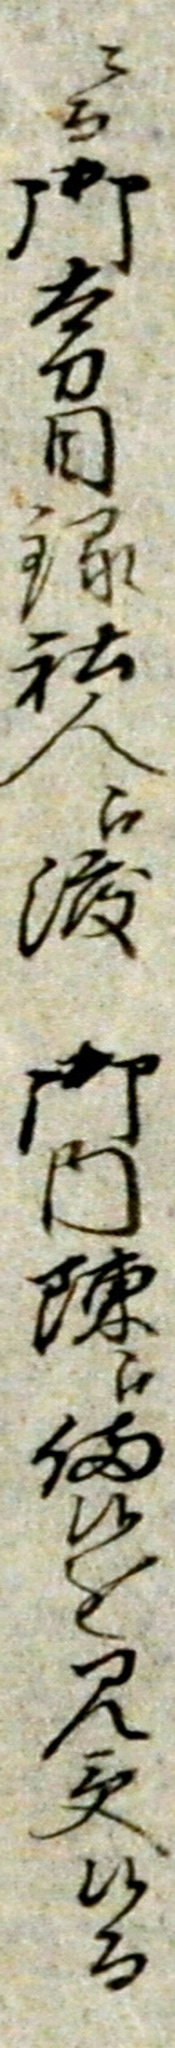ニ而御太刀目録社人江渡御内陳江備候を見受候而
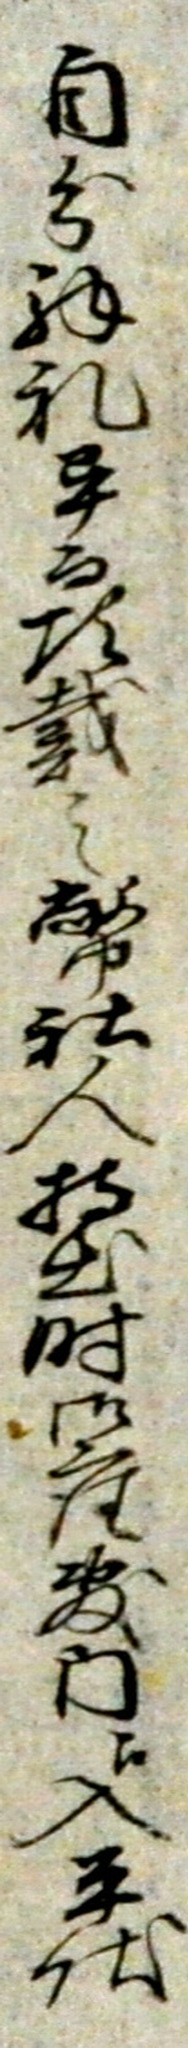自分拝礼畢而頂戴之幣社人持出時御座敷内江入平伏
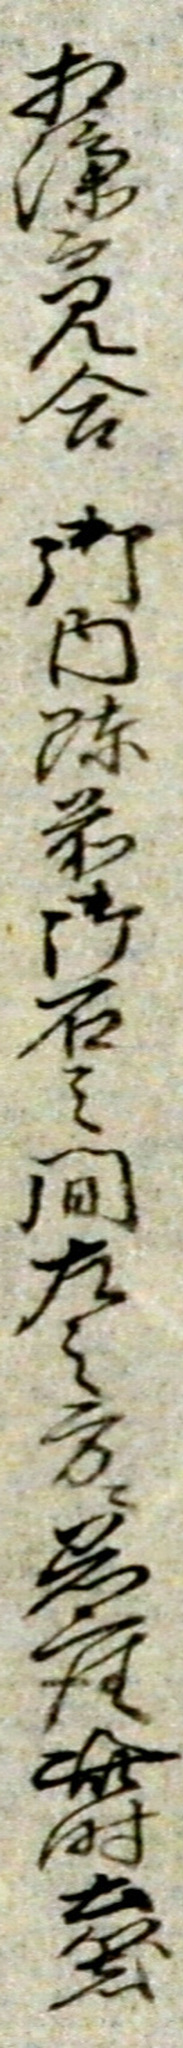相済而見合御内陳前御石之間之方ニ着座此時土器
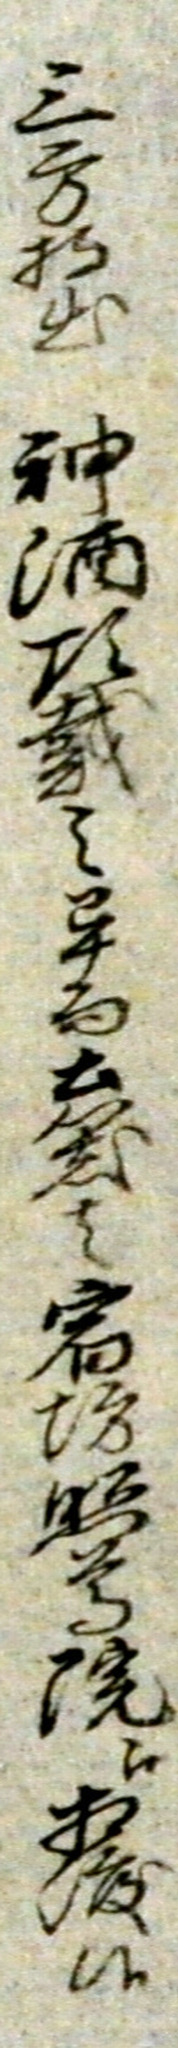三方持出神酒頂戴者畢而土器宿坊照尊院江相渡候
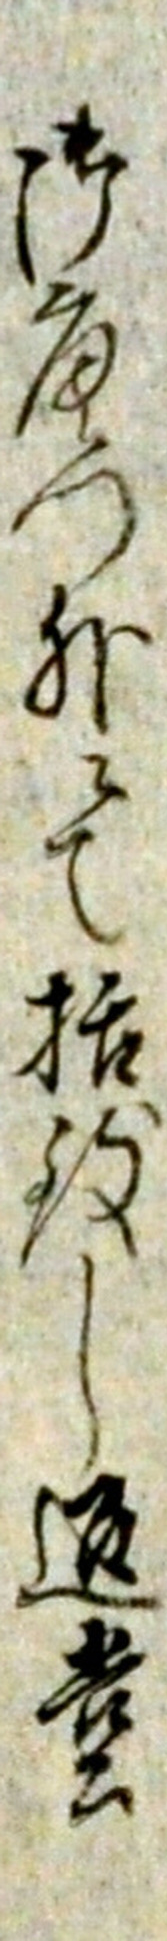御唐門外ニて括致し退去候
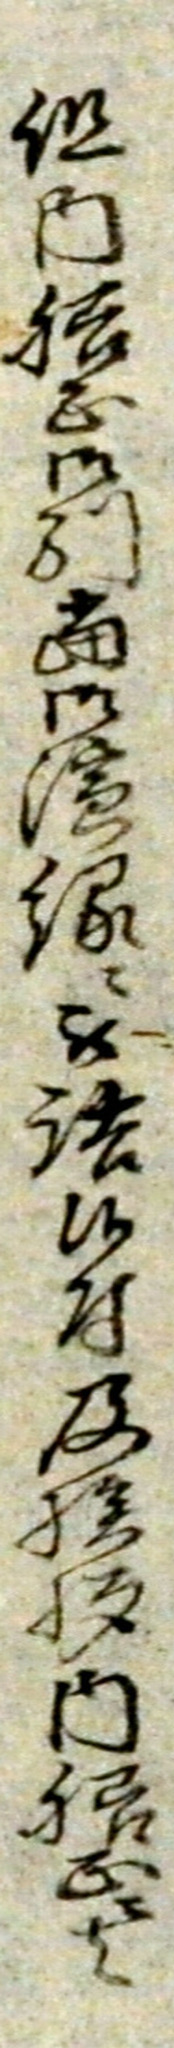但内膳正御別当御演縁ニ被詰候付及挨拶内膳正ニ者
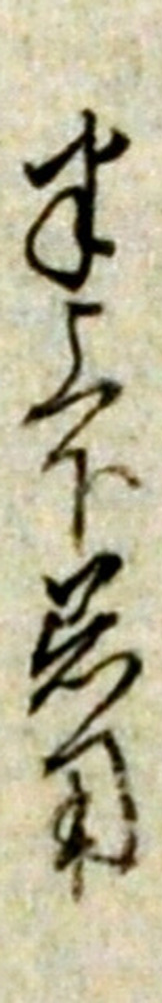半上下着用
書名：日光御名代相勤候節ノ留
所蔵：伊那市立高遠町図書館・合同会社AMANE
